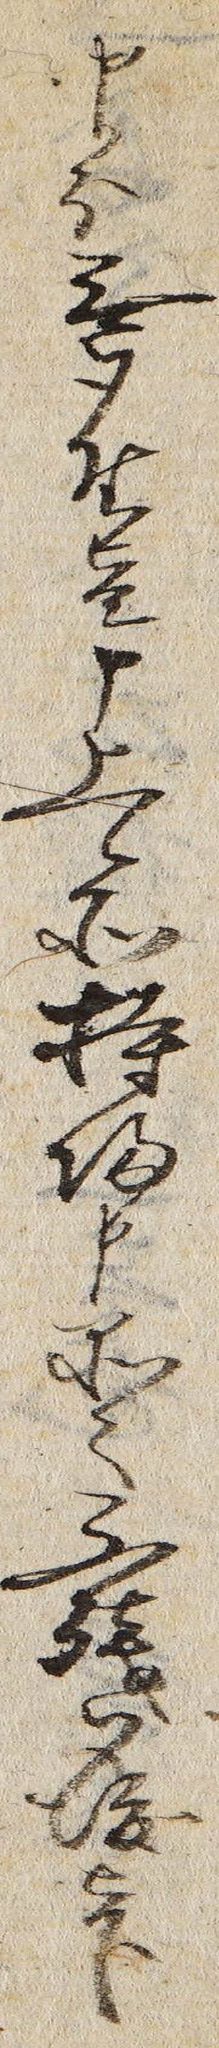申分無御座旨申上候所持帰申品々不残御渡被下
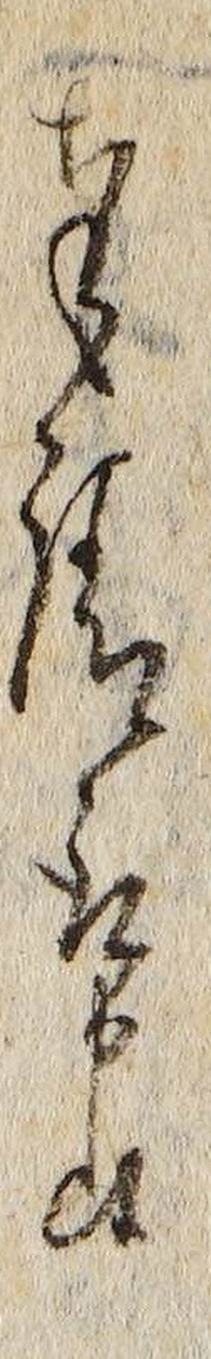奉請取申候
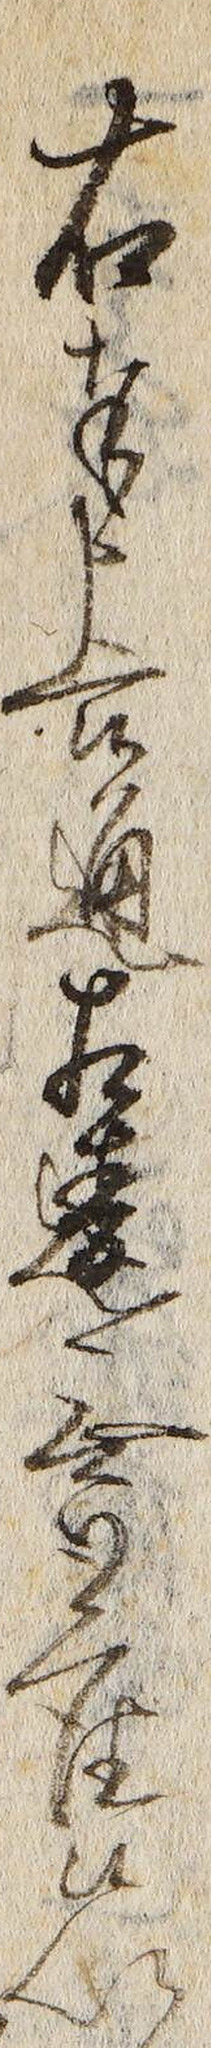右奉申上候通相違無御座候以上
